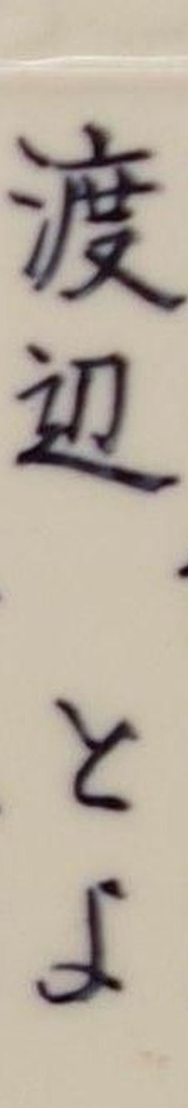渡辺とよ
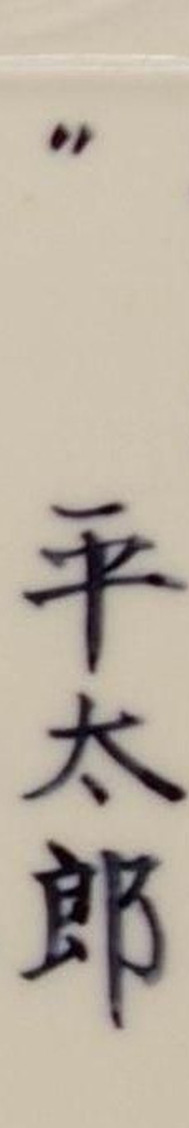平太郎
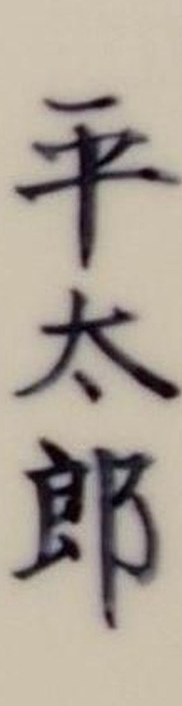平太郎
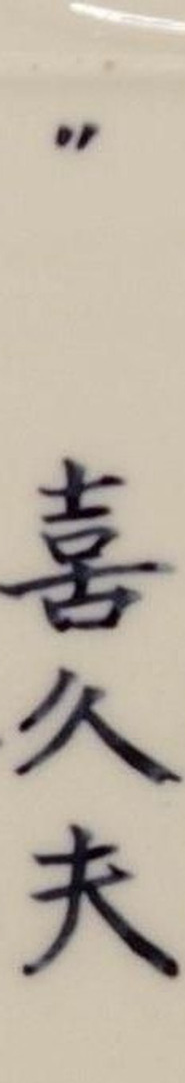喜久夫
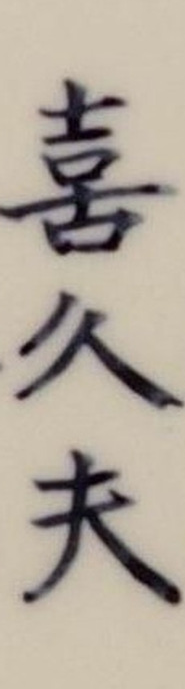喜久夫
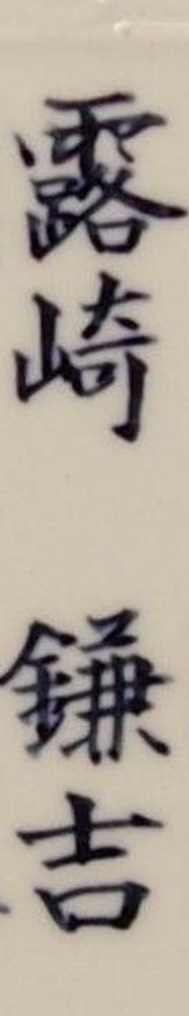露崎鎌吉
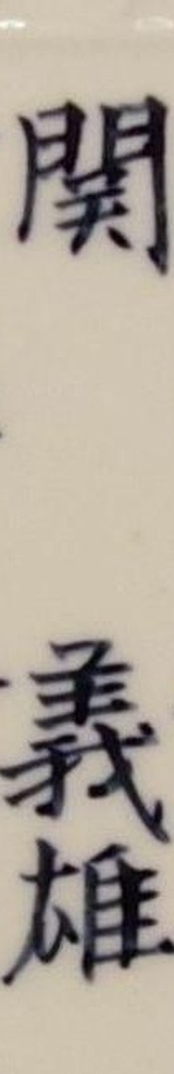関義雄
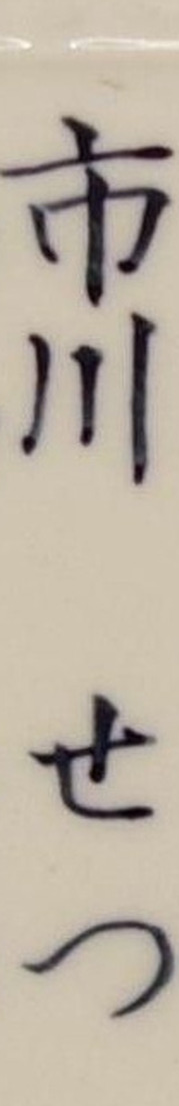市川せつ
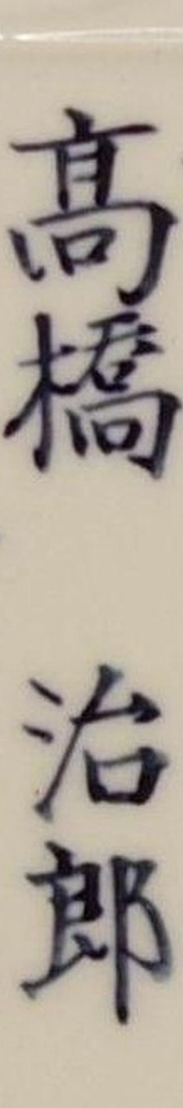高橋治郎
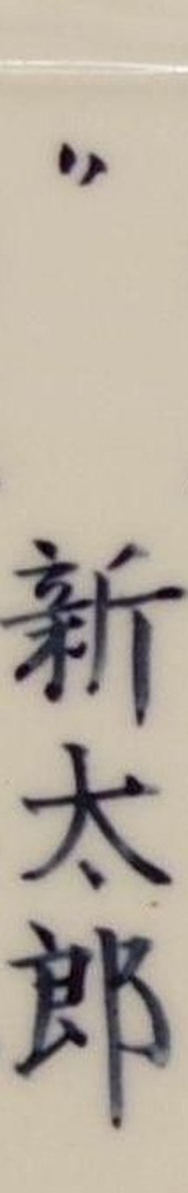新太郎
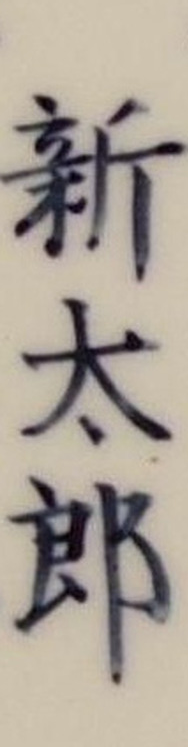新太郎
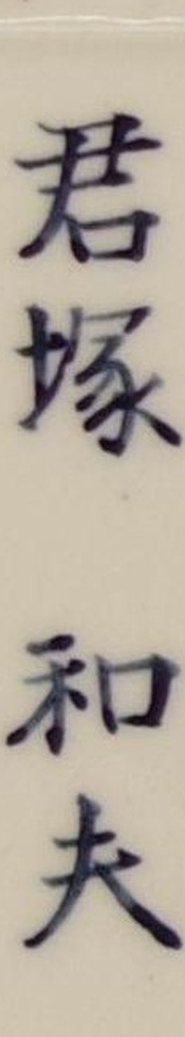君塚和夫
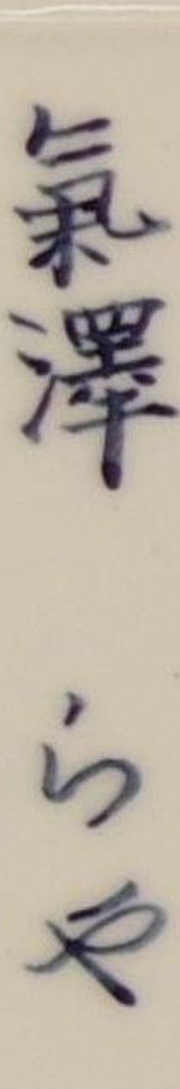気澤らや

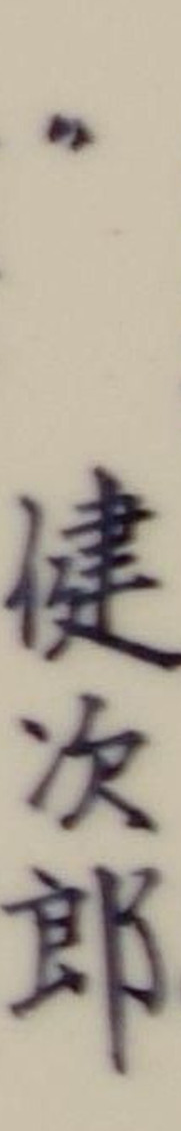健次郎
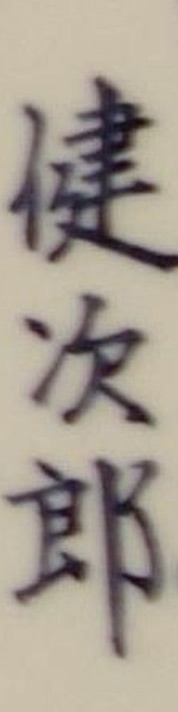健次郎
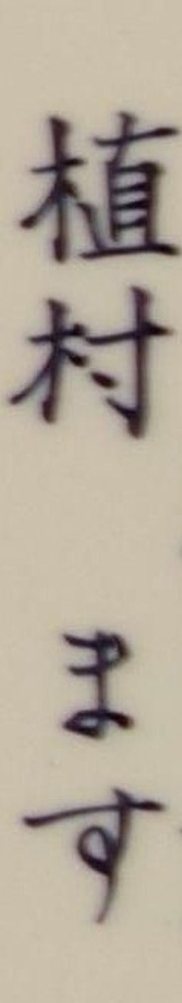植村ます
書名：M~S
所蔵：高野山金剛峯寺
